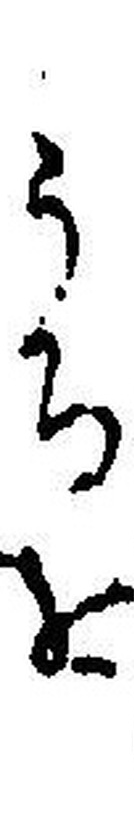うちを
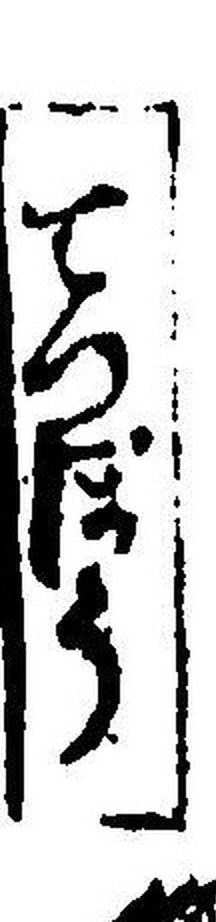てつぽう
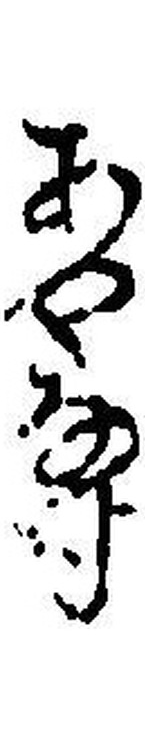あやなす
